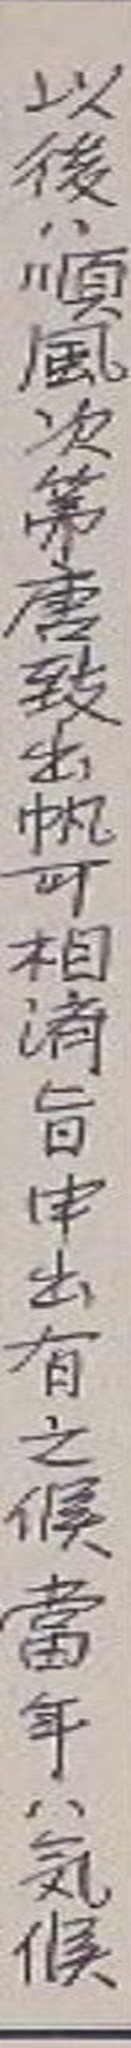以後は順風次第唐致出帆可相済旨申出有之候当年は気候
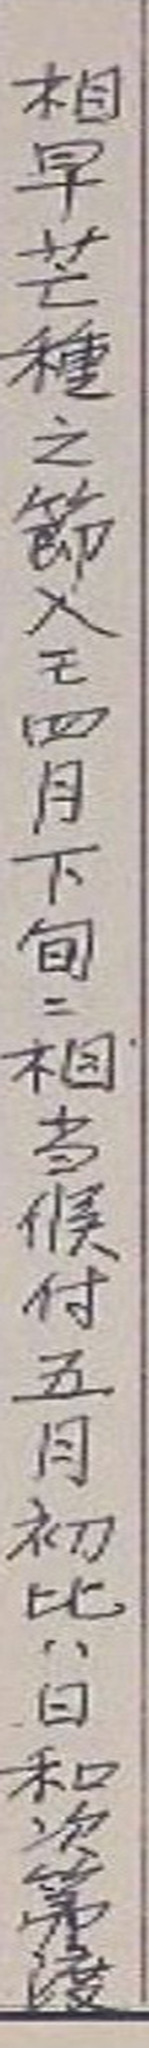相早芒種之節入も四月下旬に相当候付五月初比は日和次第渡
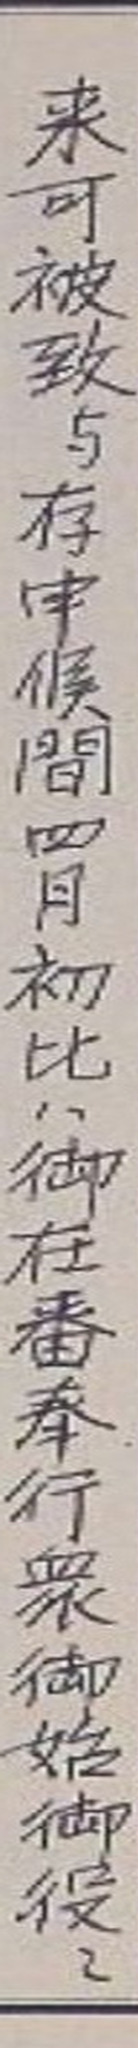来可被致と存申候間四月初比は御在番奉行衆御始御役々
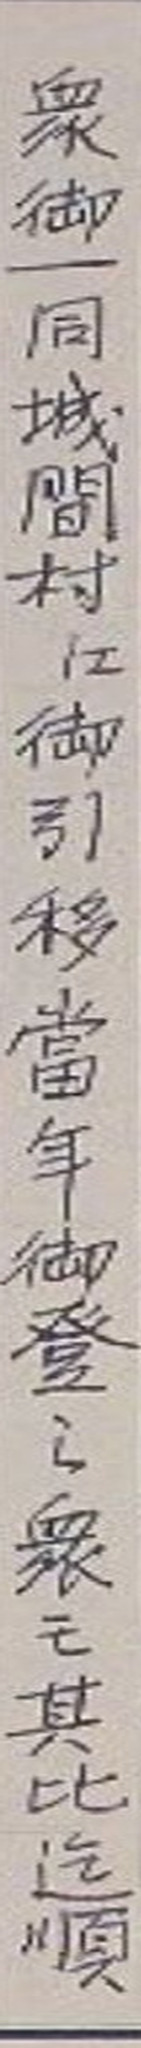衆御一同城間村え御引移当年御登之衆も其比迄順
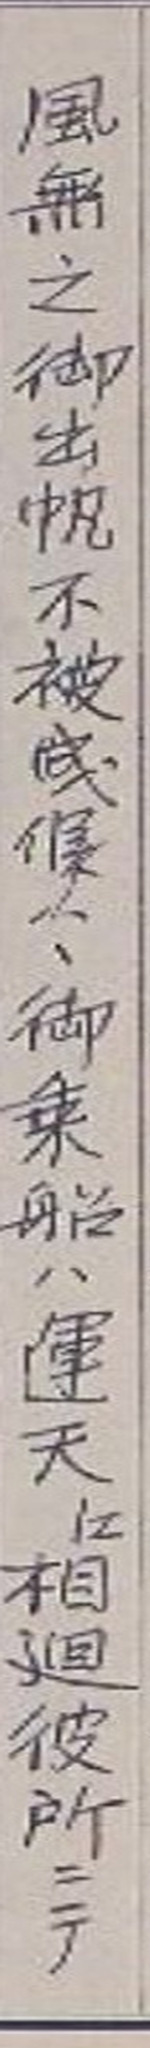風無之御出帆不被成候はゝ御乗船は運天え相廻彼所にて
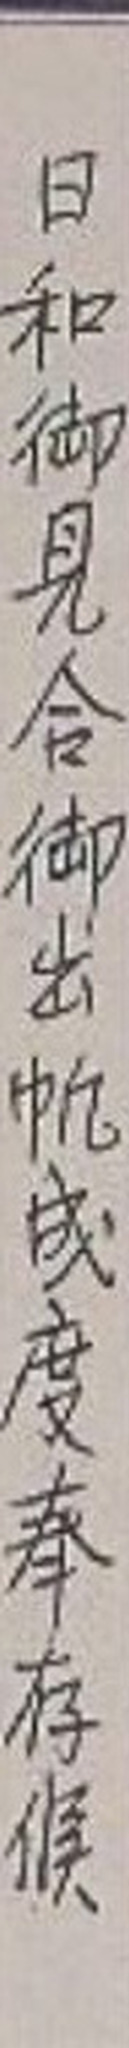日和御見合御出帆成度奉存候
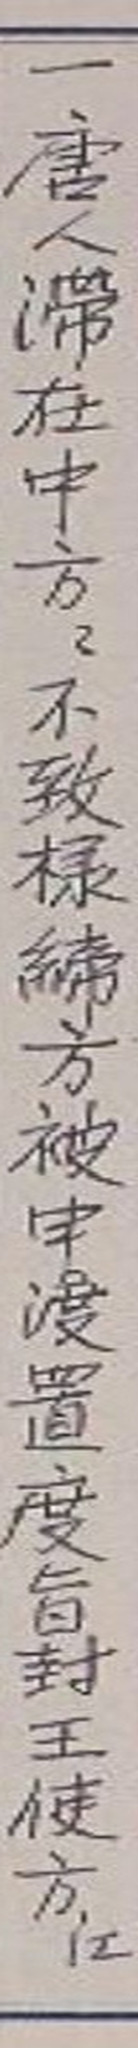一唐人滞在中方々不致様締方被申渡置度旨封王使方え
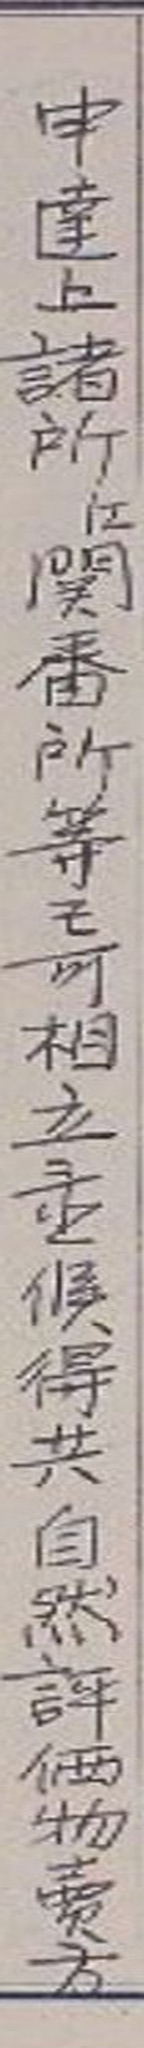申達上諸所え関番所等も可相立置候得共自然評価物売方

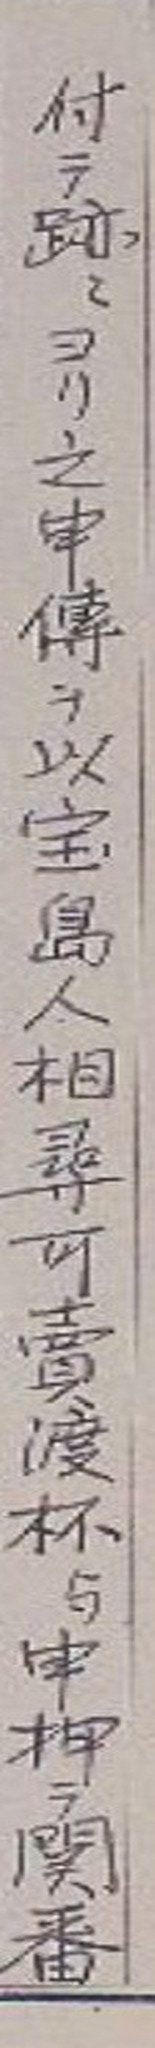付て跡々より之申伝を以宝島人相尋可売渡抔と申押て関番
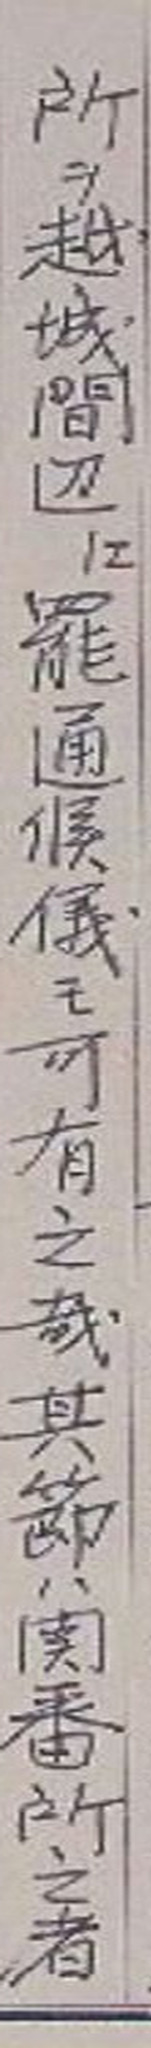所を越城間辺え罷通候儀も可有之哉其節は関番所之者
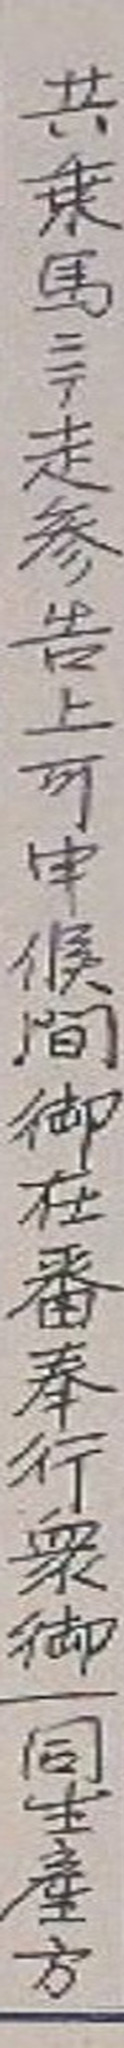共乗馬にて走参告上可申候間御在番奉行衆御一同生産方
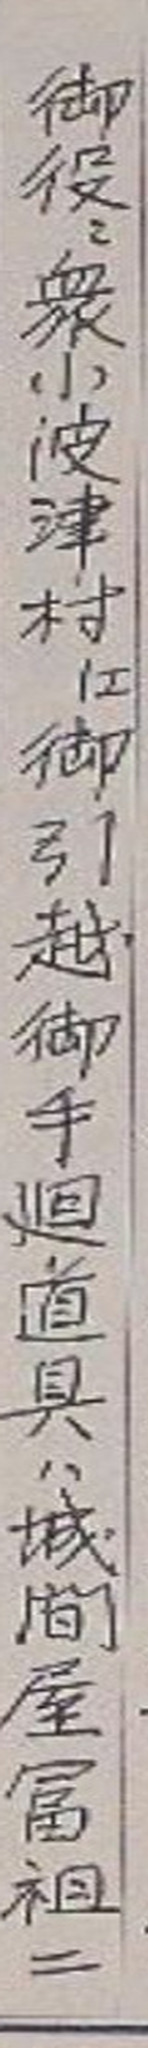御役々衆小波津村え御引越御手廻道具は城間屋冨祖二
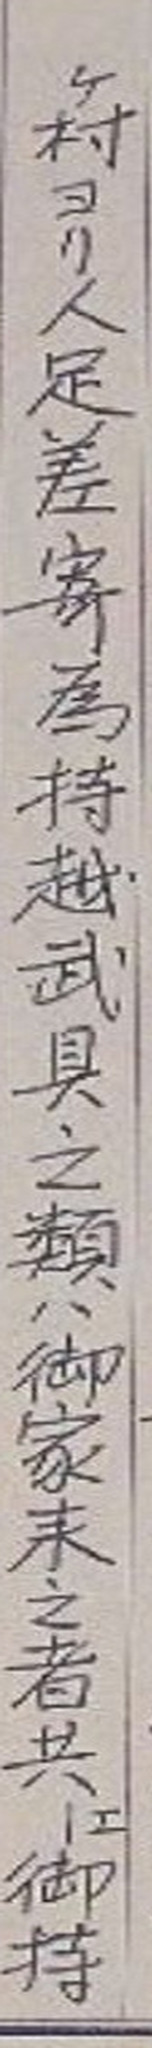ヶ村より人足差寄為持越武具之類は御家来之者共え御持
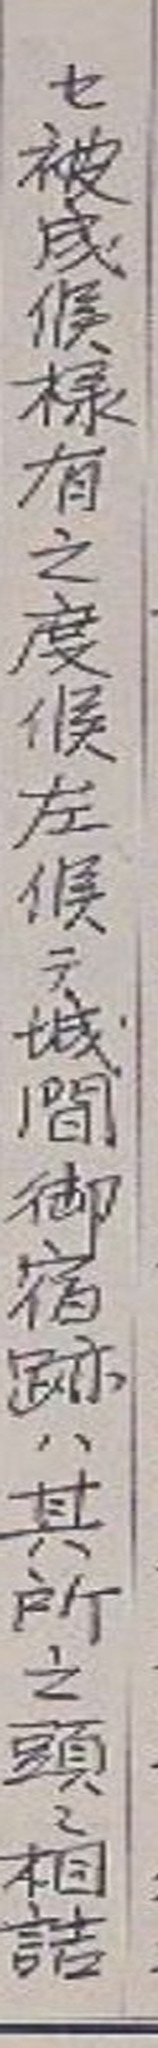せ被成候様有之度候左候て城間御宿跡は其所之頭々相詰
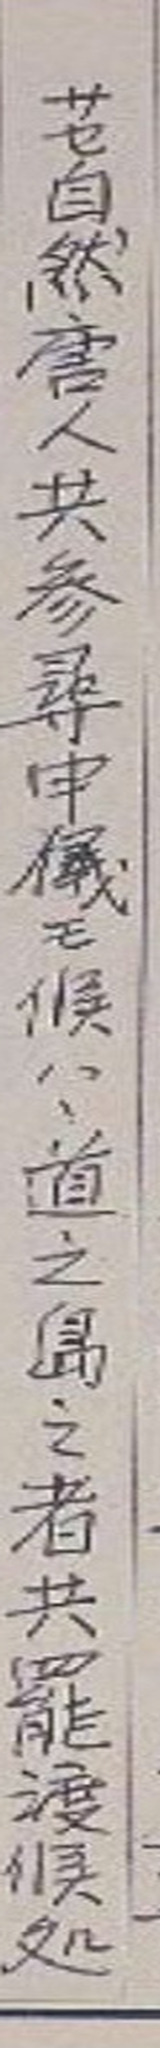させ自然唐人共参尋申儀も候はゝ道之島之者共罷渡候処
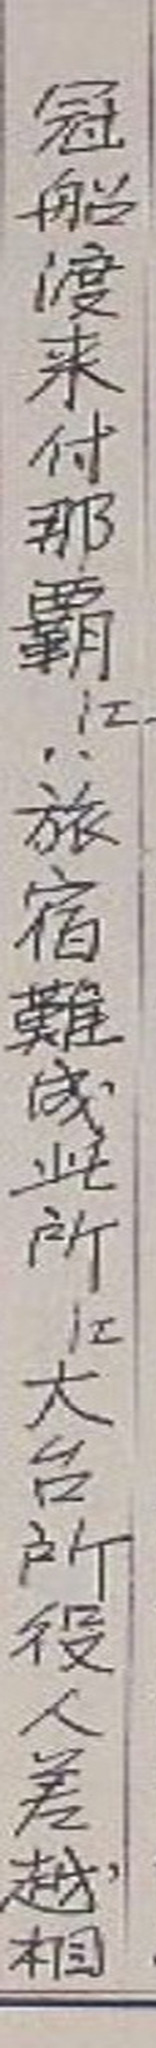冠船渡来付那覇えは旅宿難成此所え大台所役人差越相
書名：支那冊封使来琉諸記 下巻
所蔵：University of the Ryukyus Library
